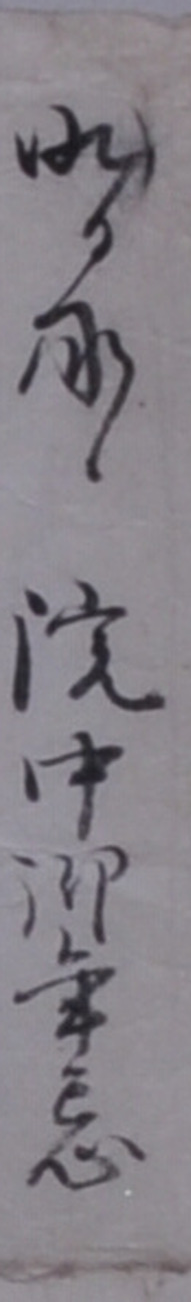昨日承候院中御年忌
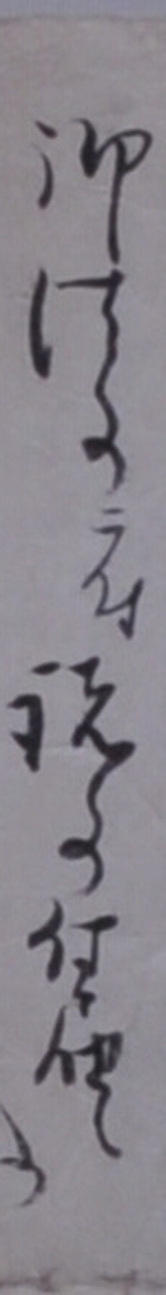御法事に付諸事付届候事
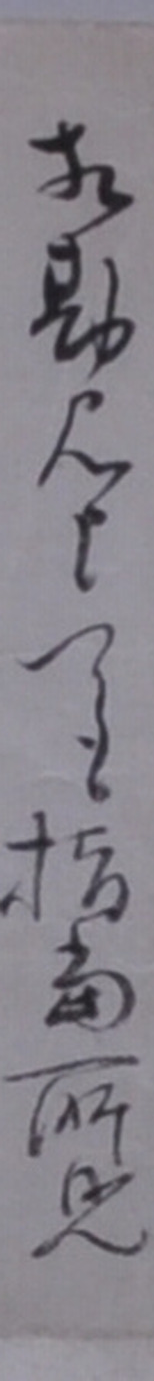相勘見申候へとも指当所見
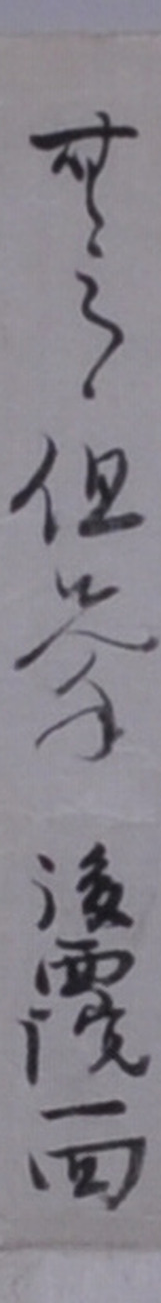無之候但先年後西院一回
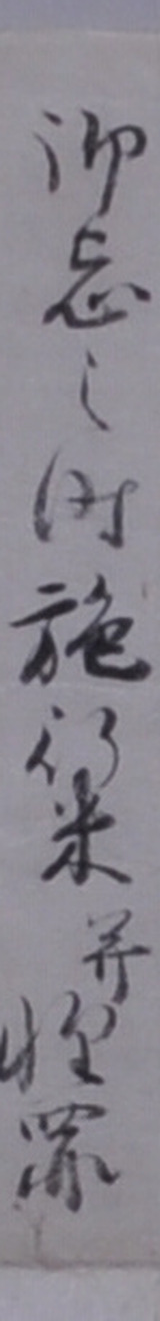御忌之時施行米并軽罪
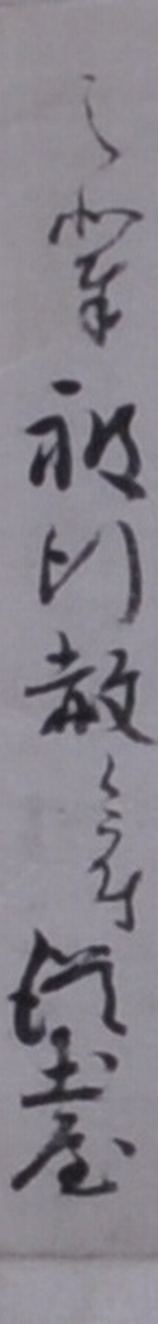之輩被行赦候に付従土屋
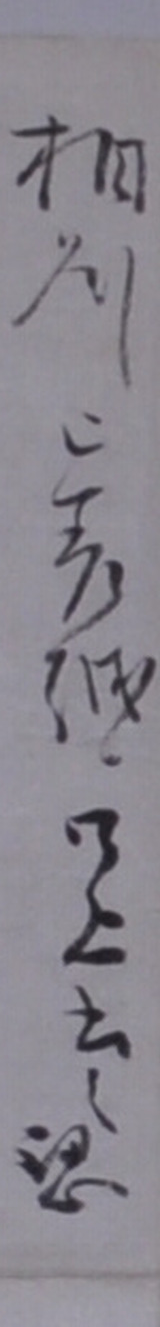相州被差越候口上書之認
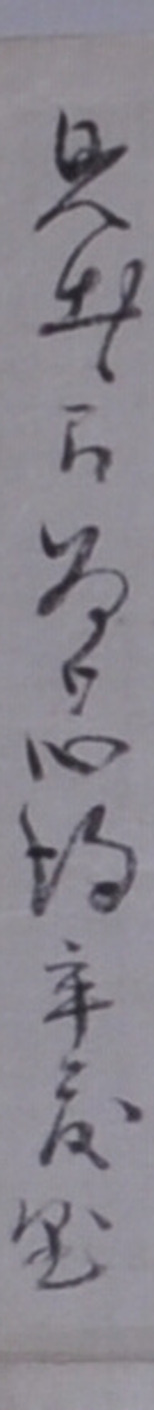見出候間為御心得卒度懸
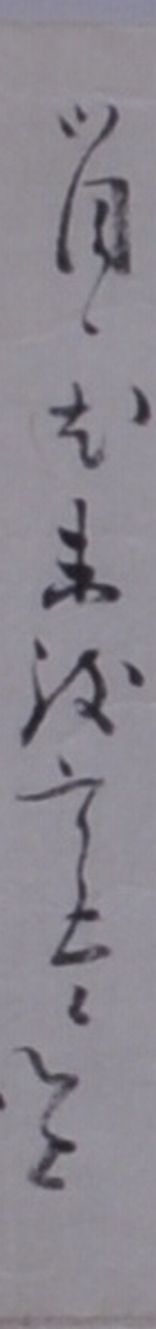御目候尤未致言上候以上
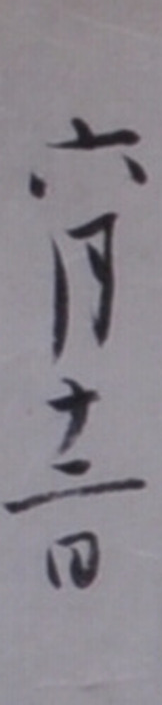六月十二日
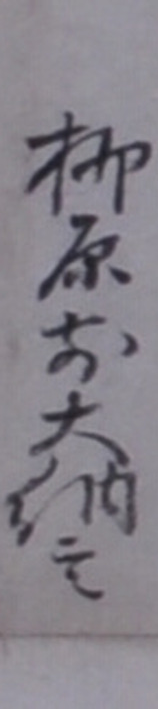柳原前大納言
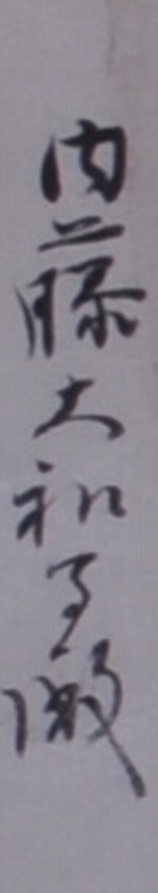内藤大和守殿
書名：書状
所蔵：伊那市立高遠町図書館・合同会社AMANE
